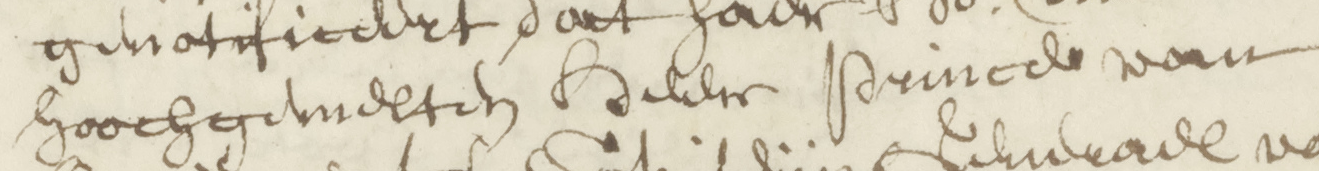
hoochgemelten Heer Prince van
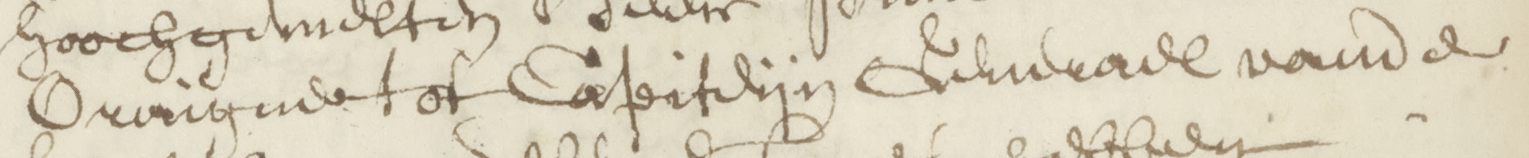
Oraigne tot Capiteijn Generael vande
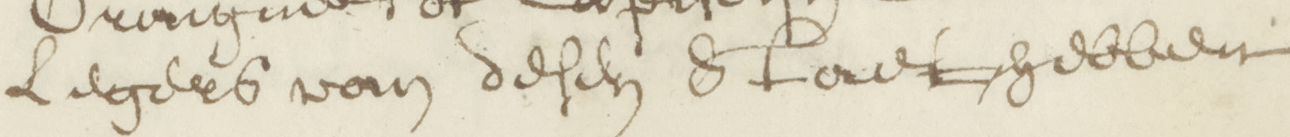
Legers van desen Staet, hebben
